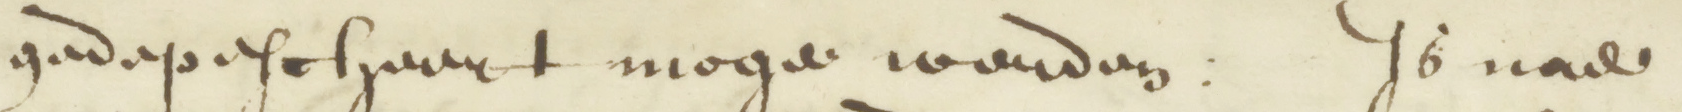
gedepescheert moge werden: Is nae
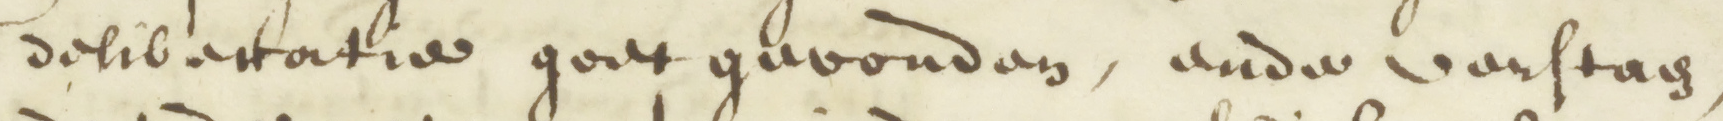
deliberatie goet gevonden, ende verstaen
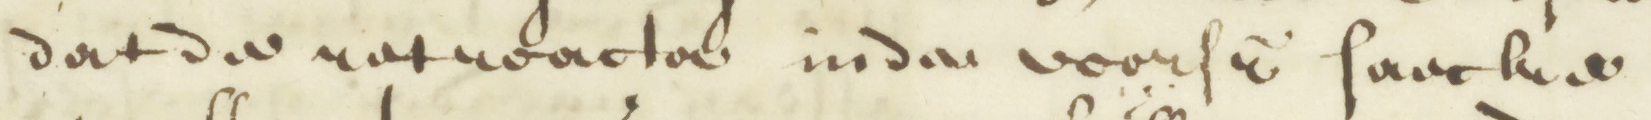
dat de retroacta inde voorsr saecke
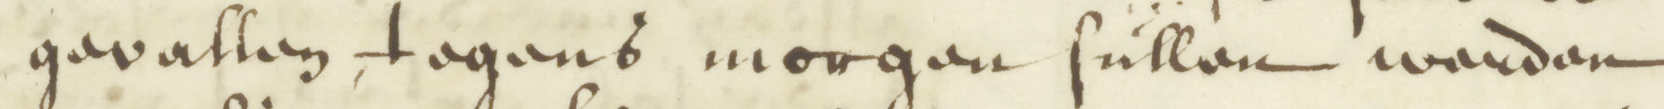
gevallen, tegens morgen sullen werden
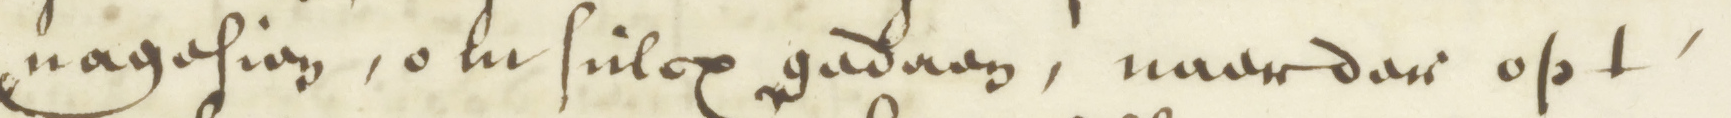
nagesien, om sulcx gedaen, naerder opt'
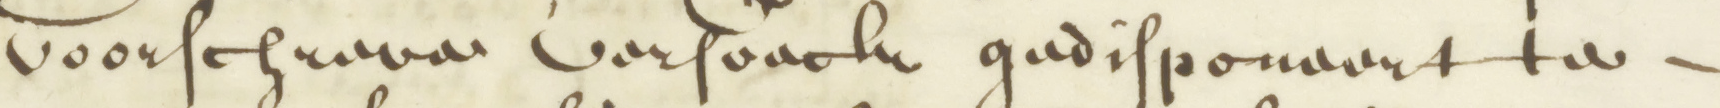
voorschreve versoeck gedisponeert te -
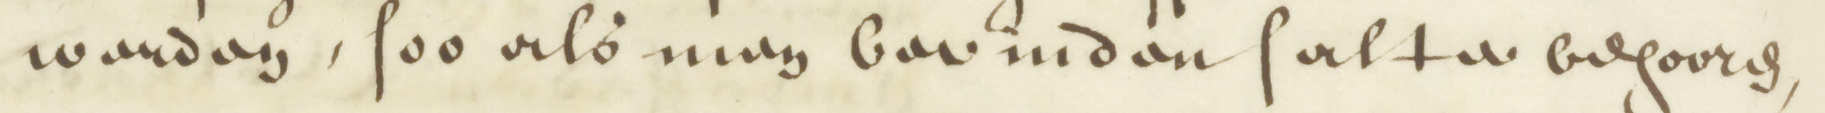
werden, soo als men bevinden sal te behooren.
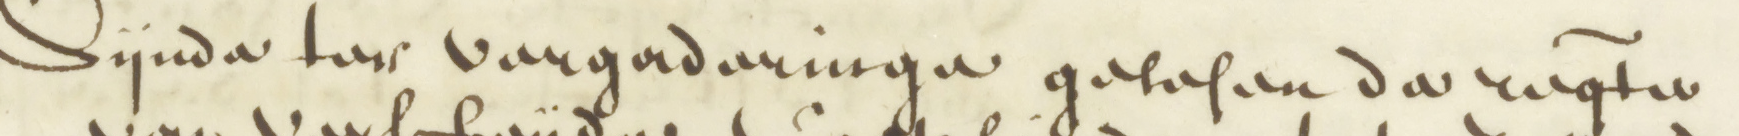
Sijnde ter vergaderinge gelesen de reqte
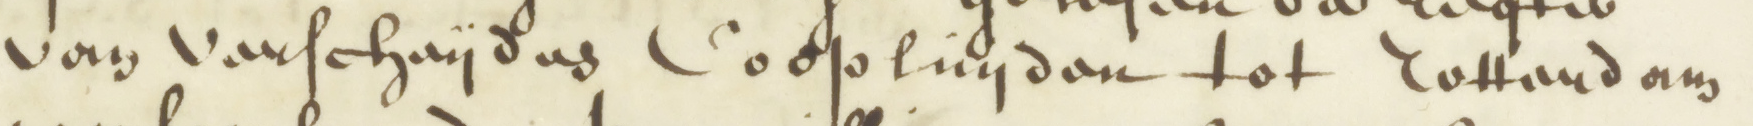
van verscheijden Coopluijden tot Rotterdam
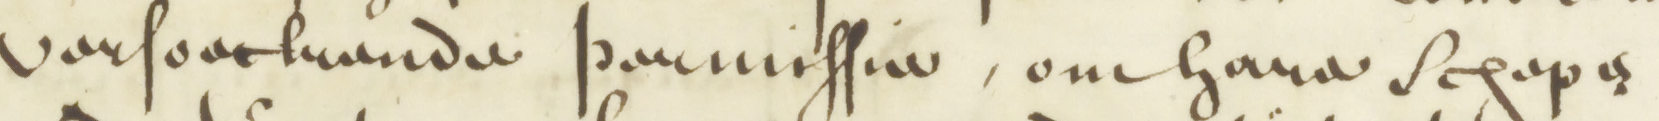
versoeckende permissie, om hare schepen
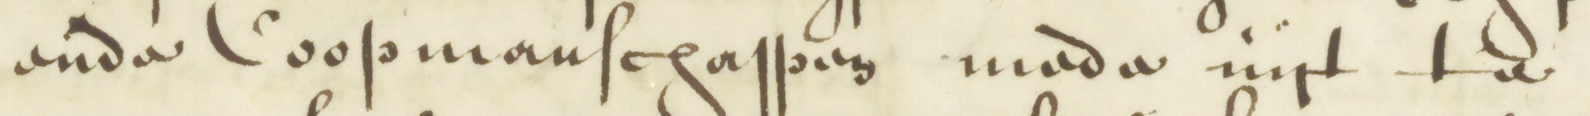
ende Coopmanschappen mede uijt te
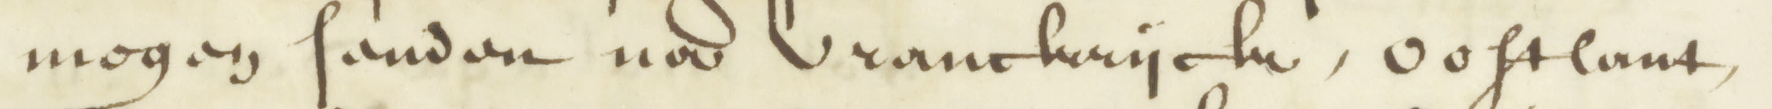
mogen senden na Vranckrijck, Oostlant,
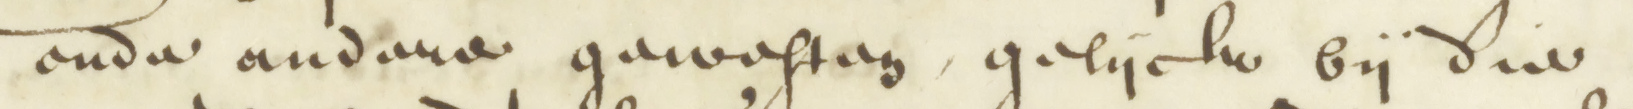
ende andere gewesten, gelijck bij die
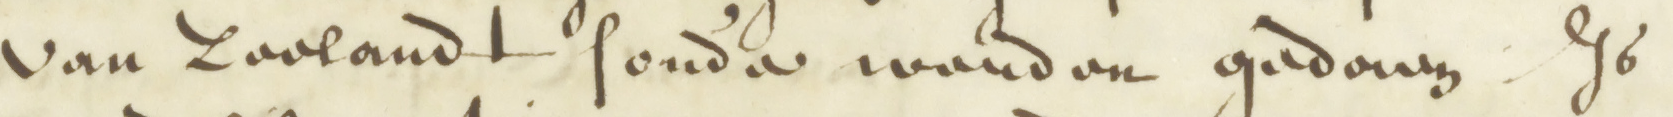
van Zeelandt soude worden gedaen: Is
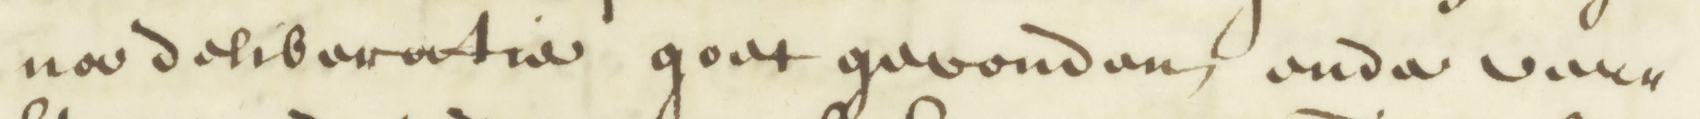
na deliberatie goet gevonden, ende ver„
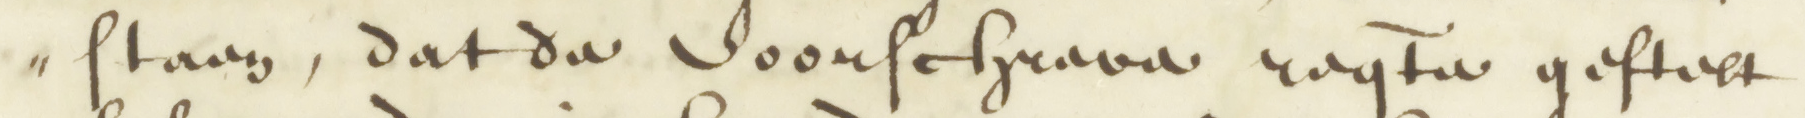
,,staen, dat de voorschreve reqte gestelt
